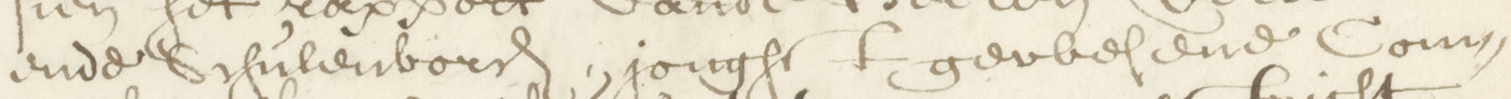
ende Schulenborch, jonghst gewesene Com„
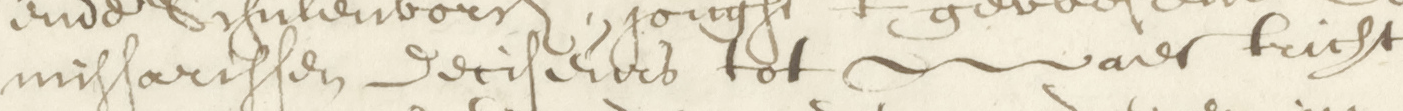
missarissen Deciseurs tot Maestricht
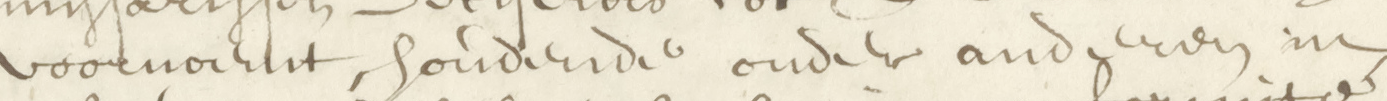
voornoem,t houdende onder anderen in
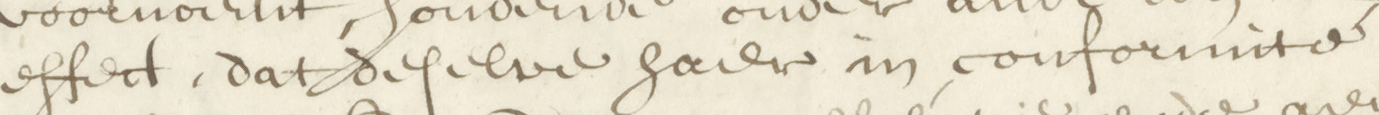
effect, dat deselve haer in conformité
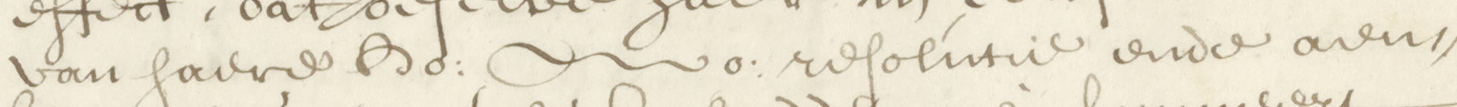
van haere Ho:Mo: resolutie ende aen,,
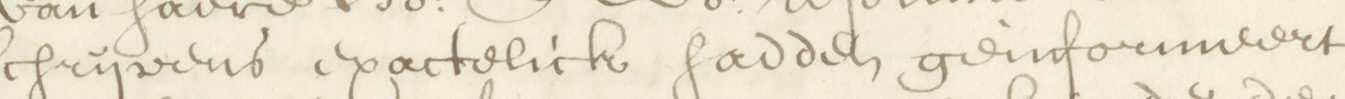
schrijvens exactelick hadden geinformeert
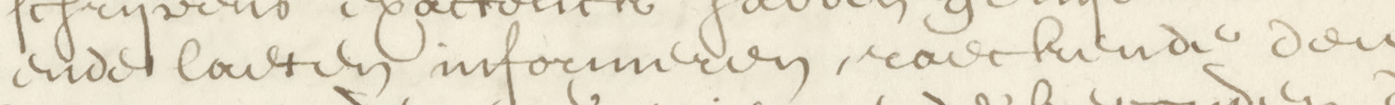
ende laeten informeren, raeckende den
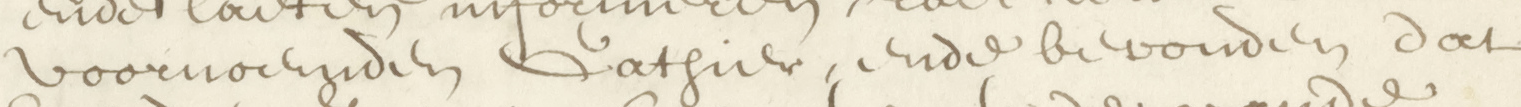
voornoemden Gathier, ende bevonden dat
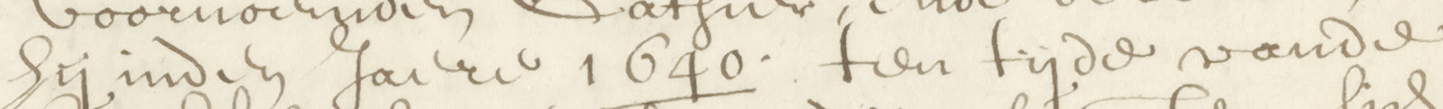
hij inden Jaere 1640. ten tijde vande
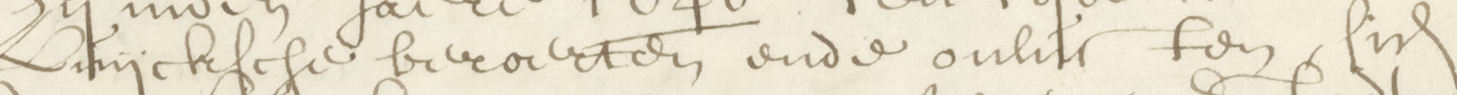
Luijcksche beroerten ende onlusten, sich
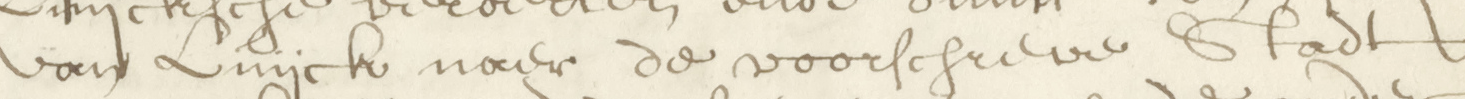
van Luijck naer de voorschreve Stadt
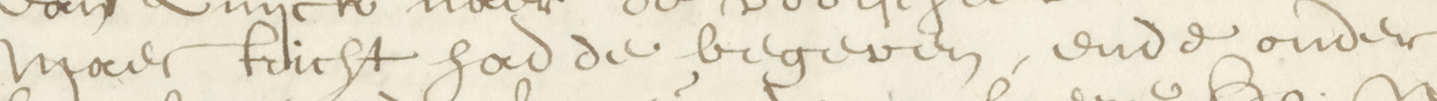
Maestricht hadde begeven, ende onder
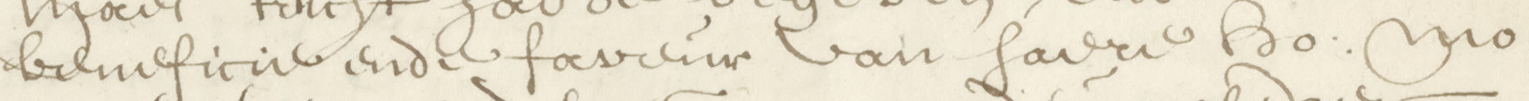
beneficie ende faveur van haere Ho:Mo:
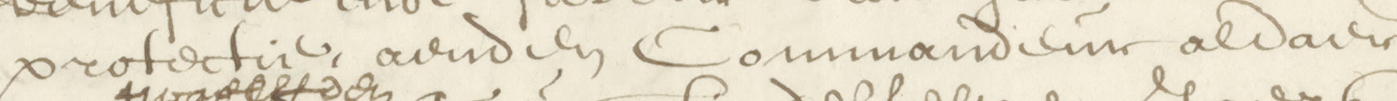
protectie, aenden Commandeur aldaer
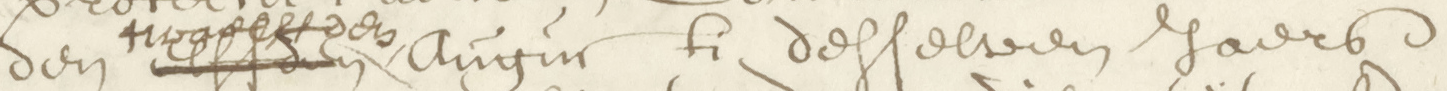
den elffden twaelffden Augusti desselven Jaers
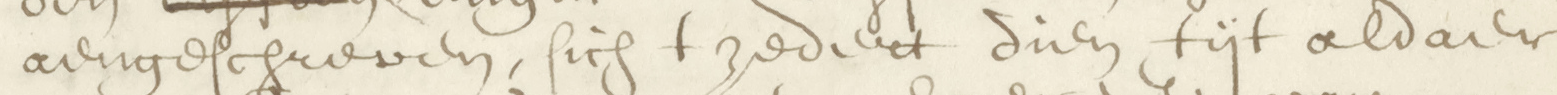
aengeschreven, sich t zedert dien tijt aldaer
